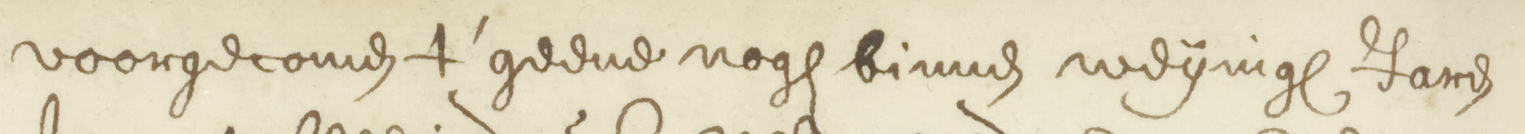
voorgecomen t'geene nogh binnen weijnigh Jaren
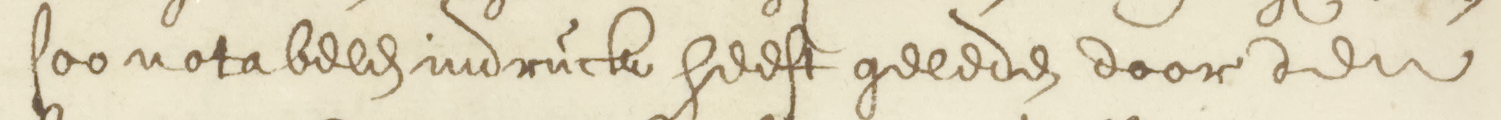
soo notabelen indruck heeft geleden door den
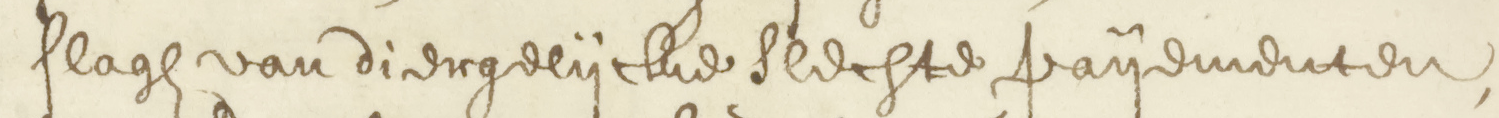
slagh van diergelijcke slechte paijementen,
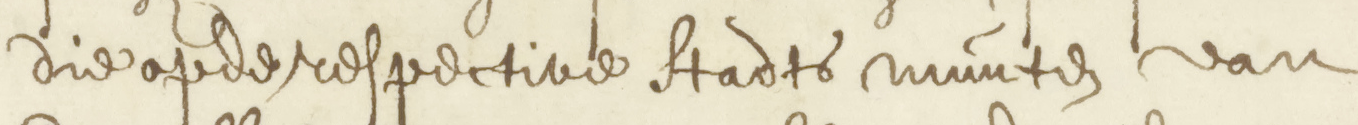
die opde respective stadtsmunten van
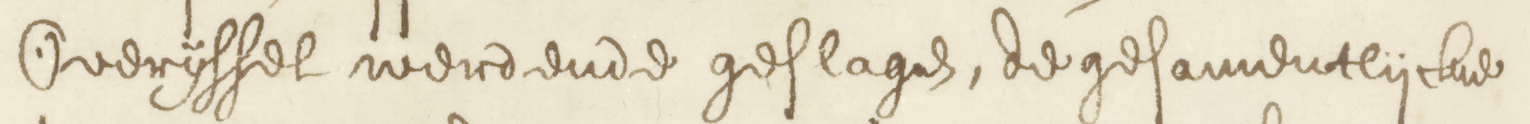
Overijssel werdende geslagen, de gesamentlijcke
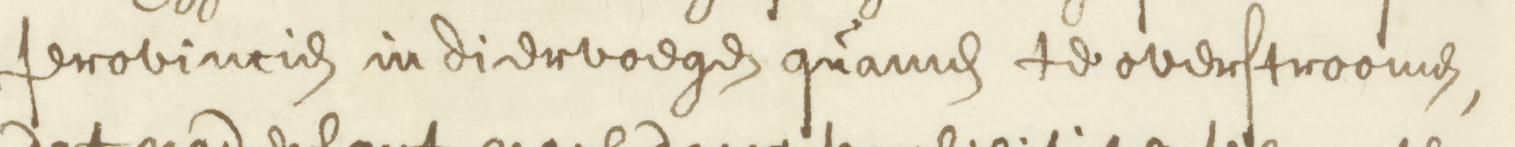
provincien in diervoegen quamen te overstroomen,
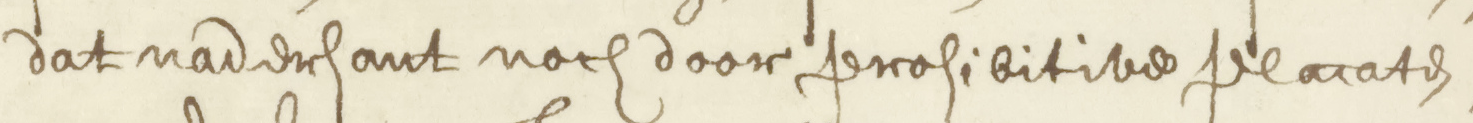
dat naderhant noch door prohibitive placaten
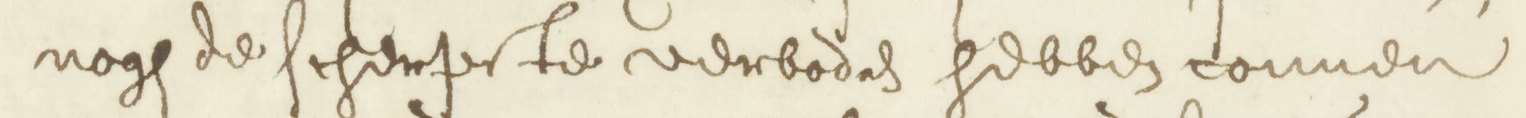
nogh de scherpste verboden hebben connen
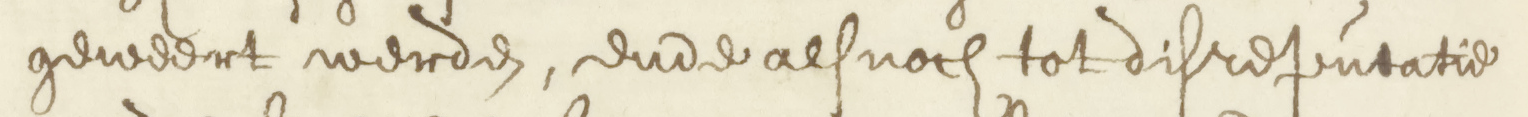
geweert werden, ende alsnoch tot disreputatie
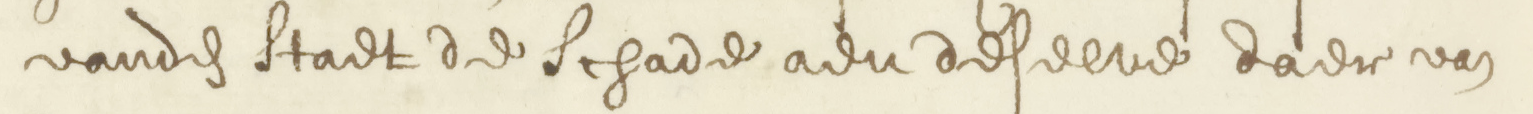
vanden staet de schade aen deselve daer van
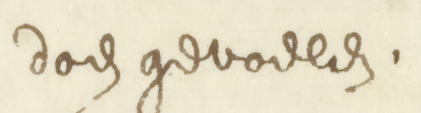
doen gevoelen.
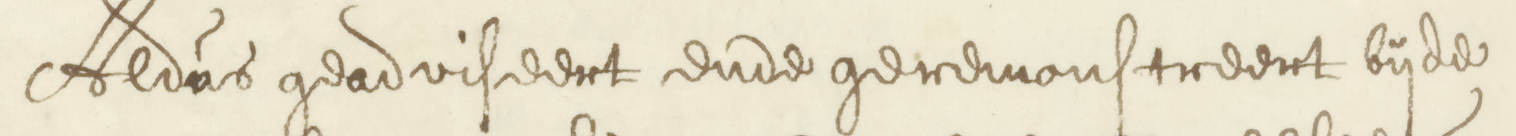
Aldus geadviseert, ende geremonstreert bijde
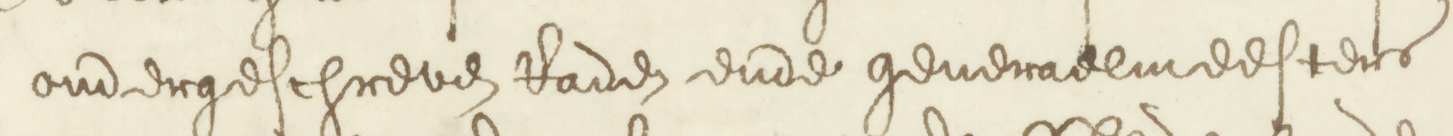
ondergeschreven Raden ende generaelmeesters
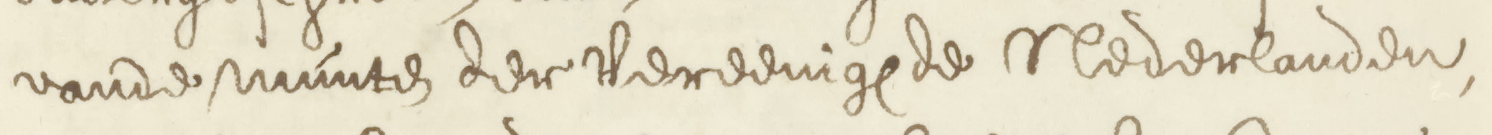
vande munten der Vereenighde Nederlanden,
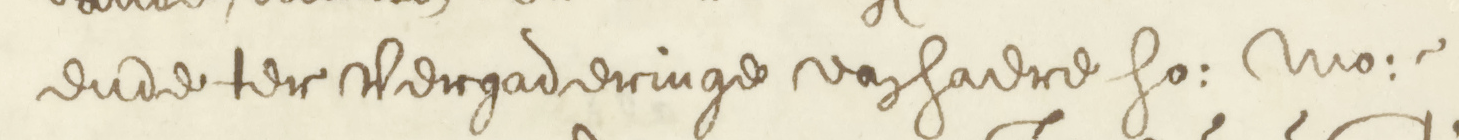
ende ter vergaderinge van haere Ho:Mo:
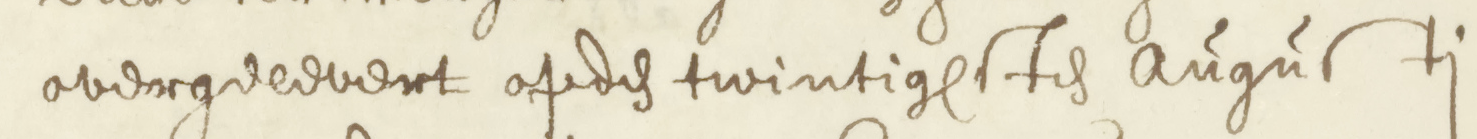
overgelevert opden twintighsten Augusti
